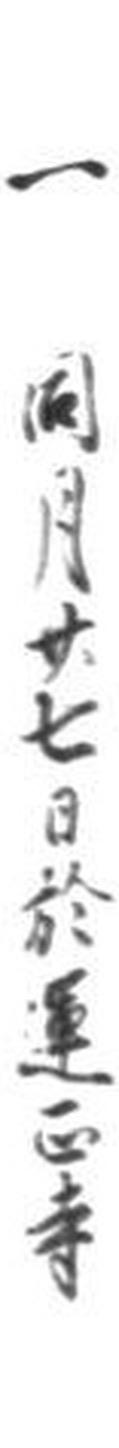一同月廿七日於運正寺
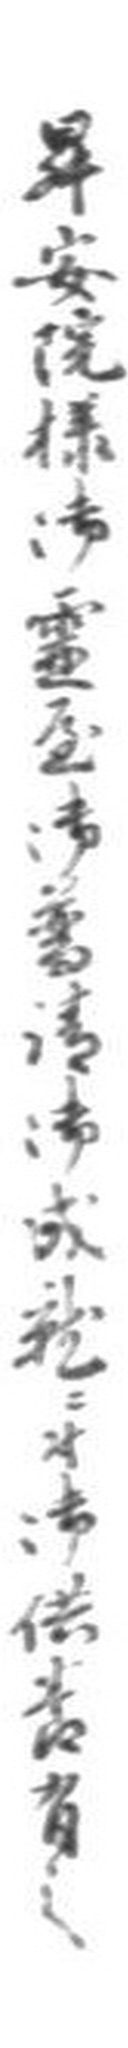昇安院様御霊屋御普請御成就ニ付御供養有之
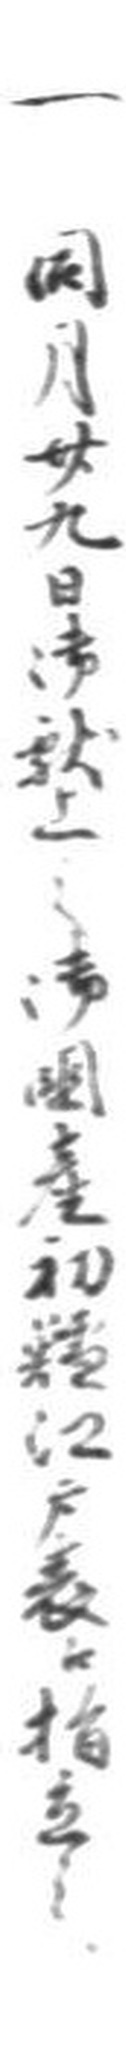一同月廿九日御献上之御国産初鱈江戸表江指立之
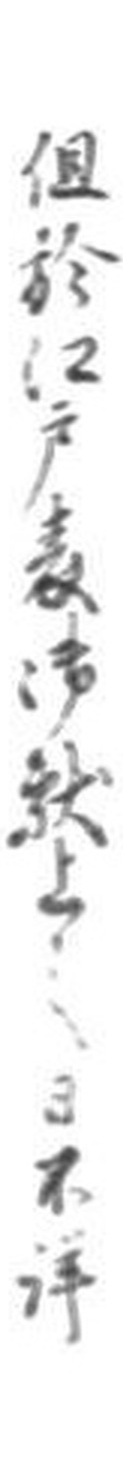但於江戸表御献上之日不詳
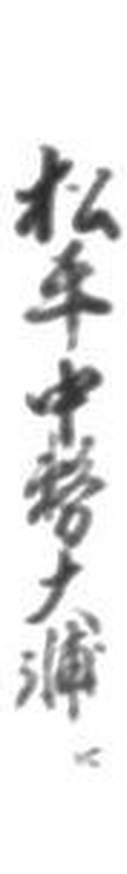松平中務大輔江
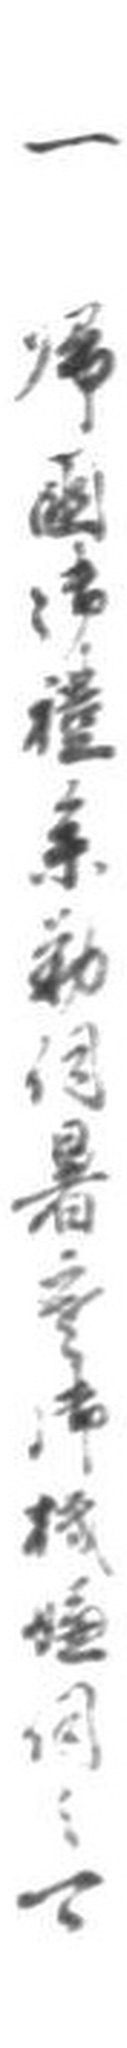一帰国御礼参勤伺暑寒御機嫌伺者可

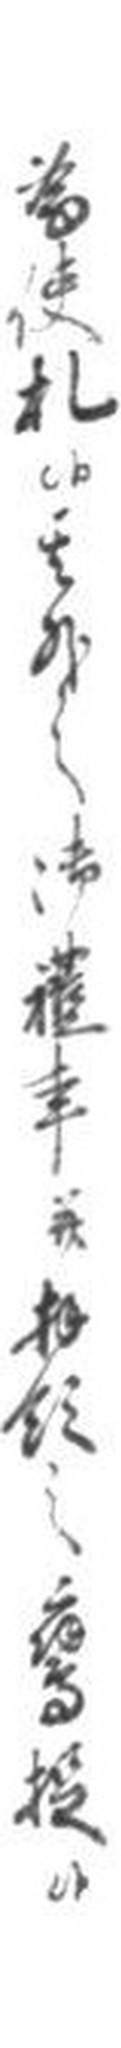為使札候其外之御礼事并拝領之鷹授候
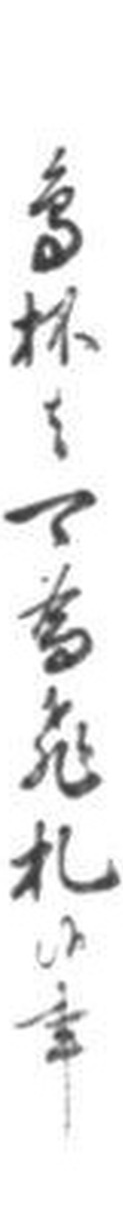鳥抔者可為飛札候事
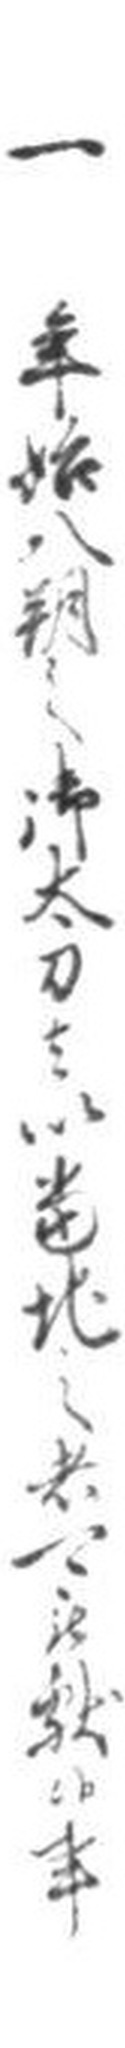一年始八朔之御太刀者以当地之者可被献候事
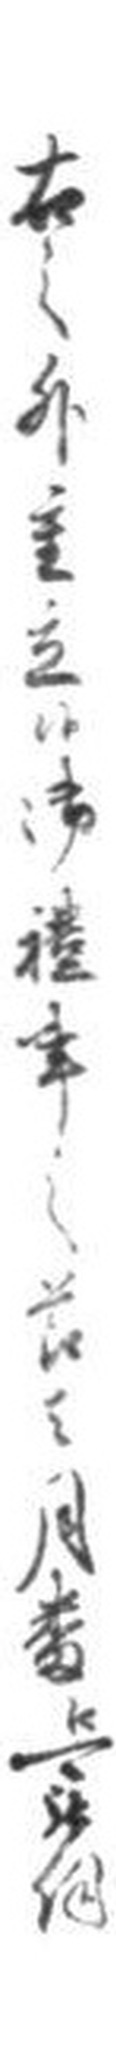右之外重立候御礼事之節者月番江可被伺
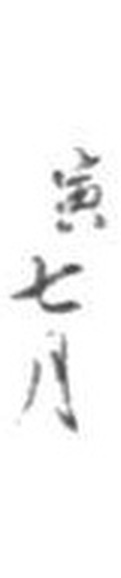寅七月
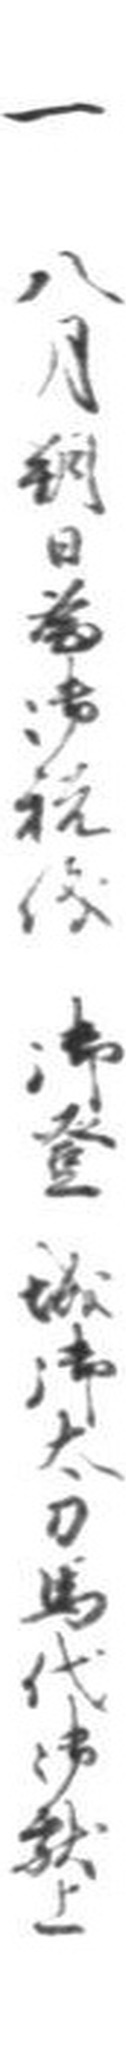一八月朔日為御祝儀御登城御太刀馬代御献上
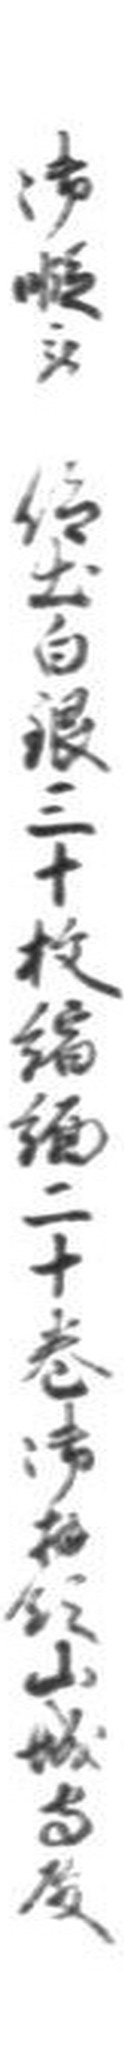御暇被仰出白銀三十枚縮緬二十巻御拝領山城守殿
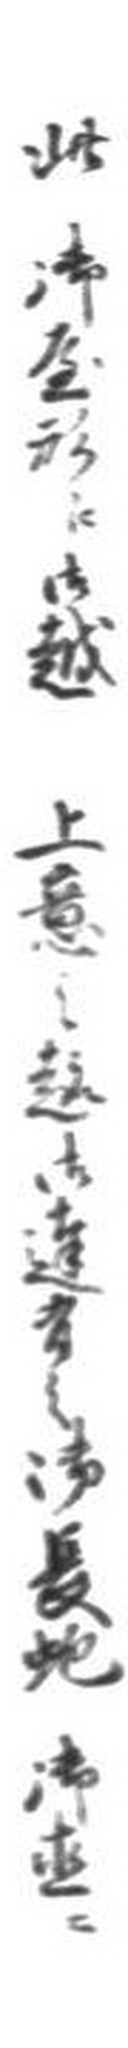此御屋形江御越上意之趣御達有之御長蚫御直ニ
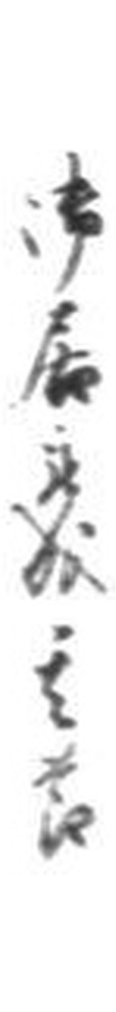御居被成其節
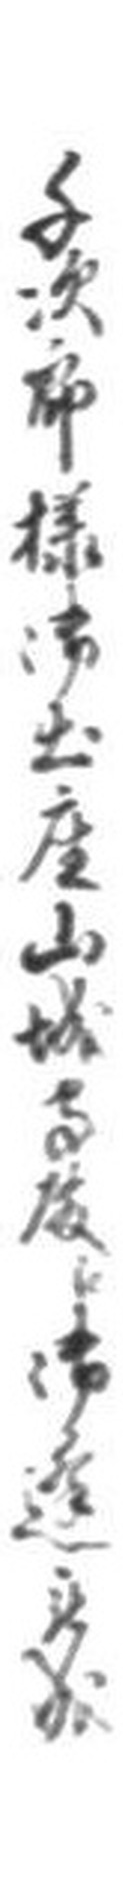千次郎様御出座山城守殿江御逢被成
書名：家譜 三十五 宗昌公 従享保六年到同七年
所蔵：福井県文書館 Fukui Prefectural Archives
